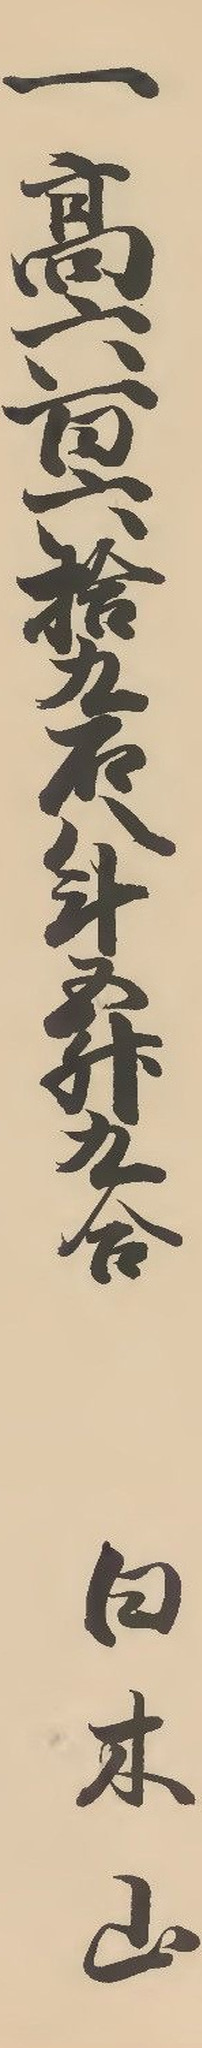一髙六百六拾九石八斗五升九合白木山
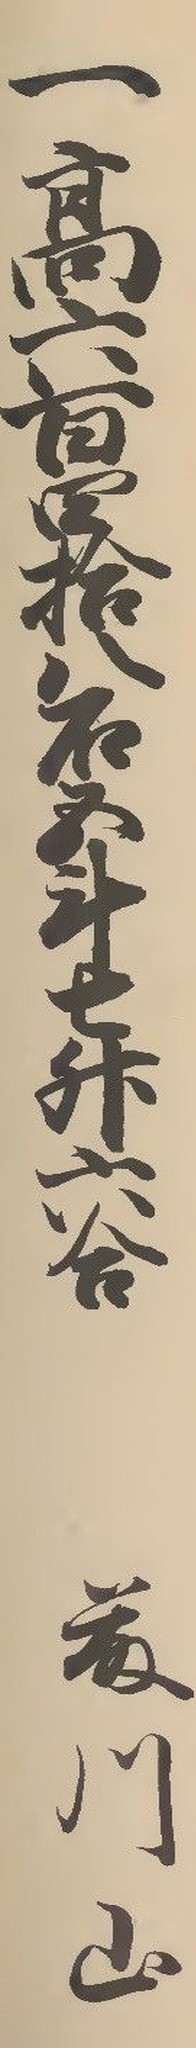一髙六百四拾八石五斗七升六合藤川山
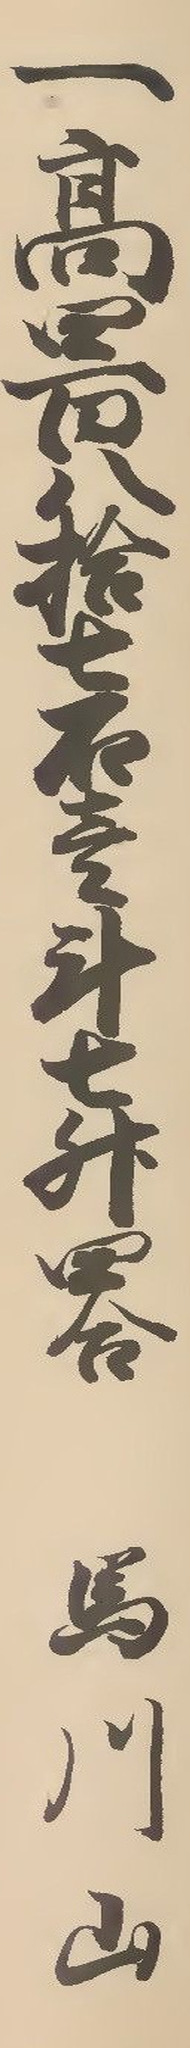一髙四百八拾七石壱斗七升四合馬川山
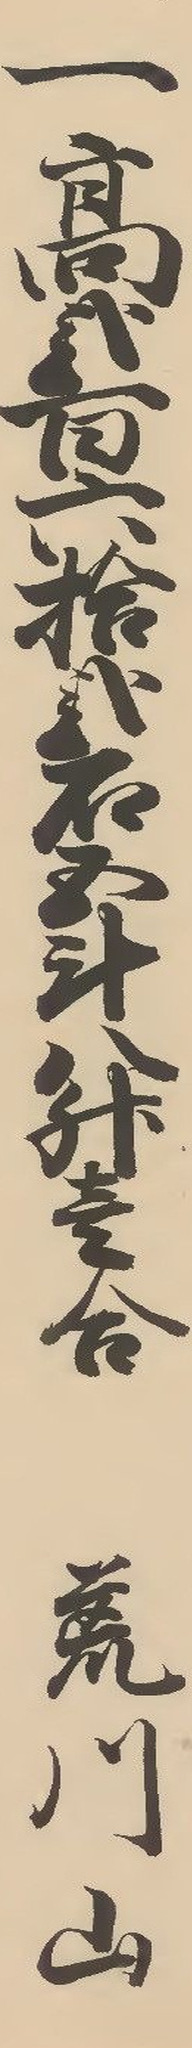一髙弐百六拾弐石五斗八升壱合荒川山
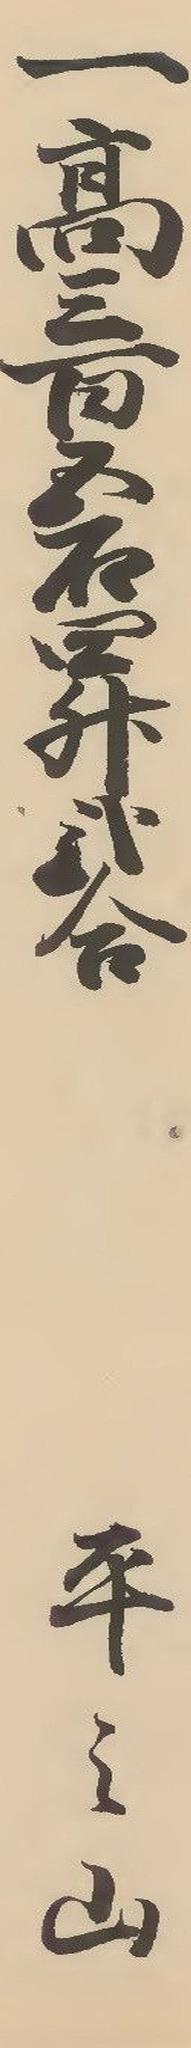一髙三百五石四升弐合平之山
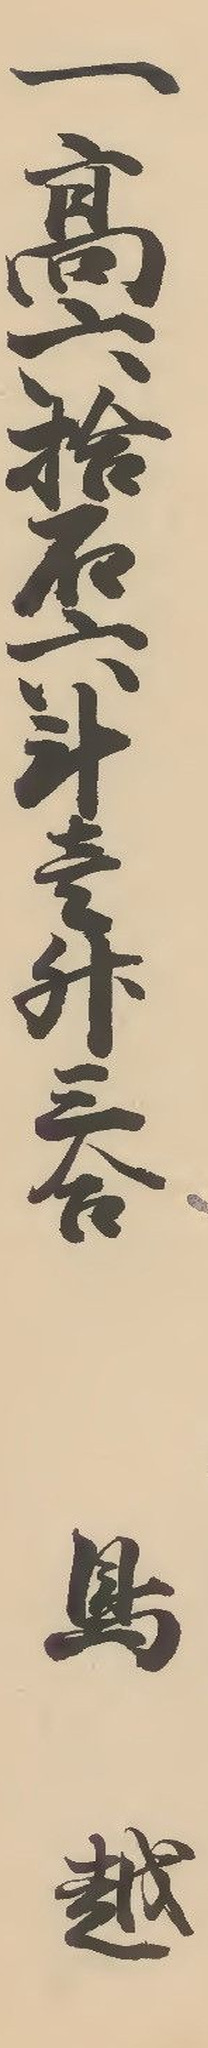一髙六拾石六斗壱升三合鳥越

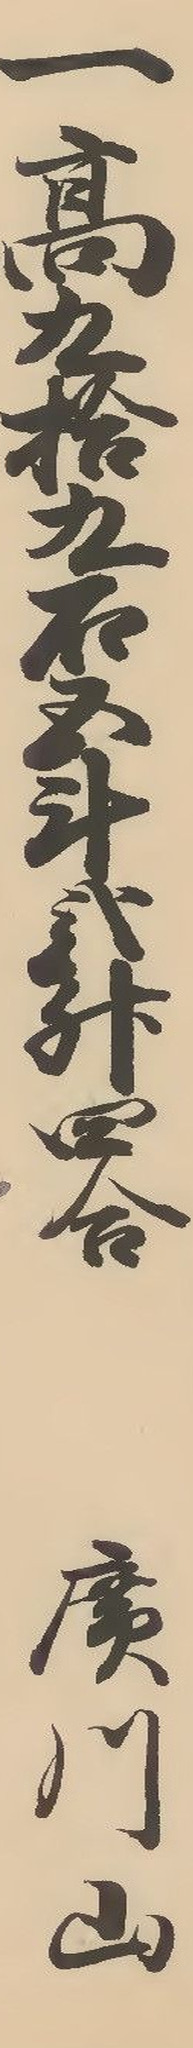一髙九拾九石五斗弐升四合廣川山
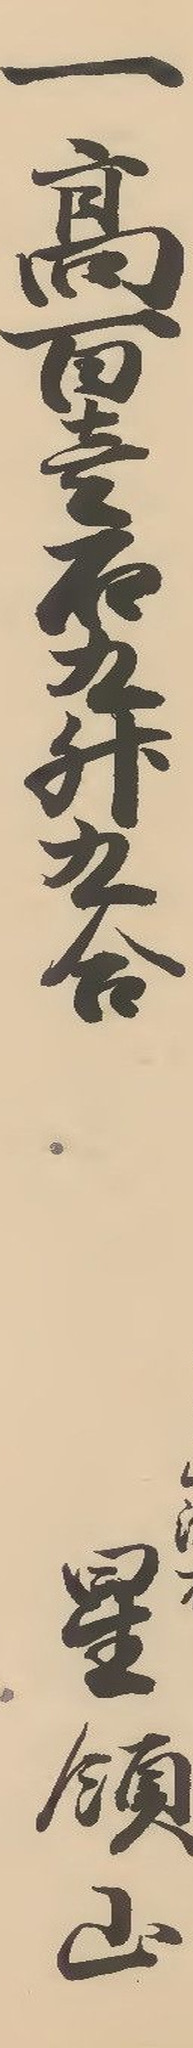一髙百壱石九升九合星領山
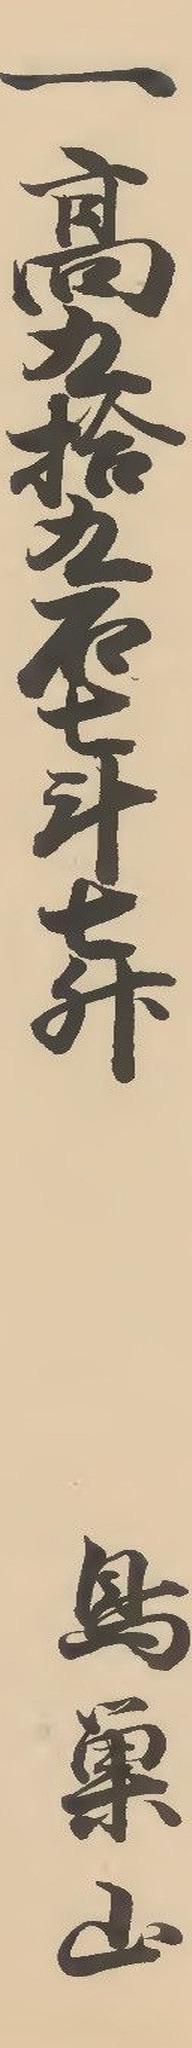一髙九拾九石七斗七升鳥巣山
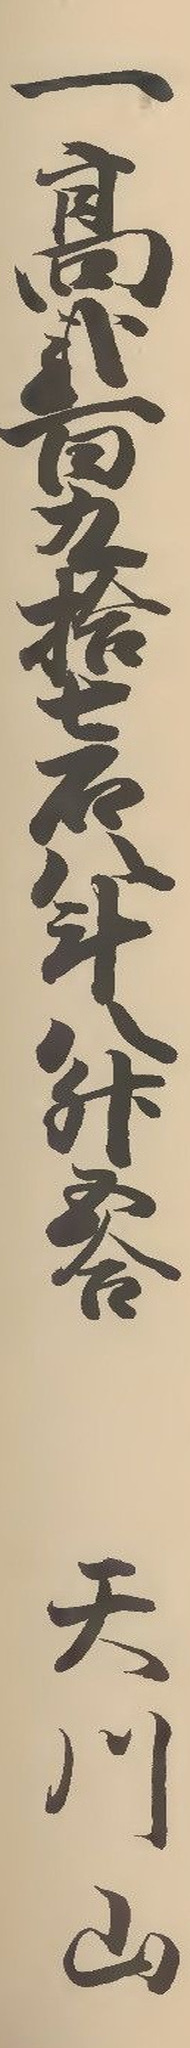一髙弐百九拾七石八斗八升五合天川村
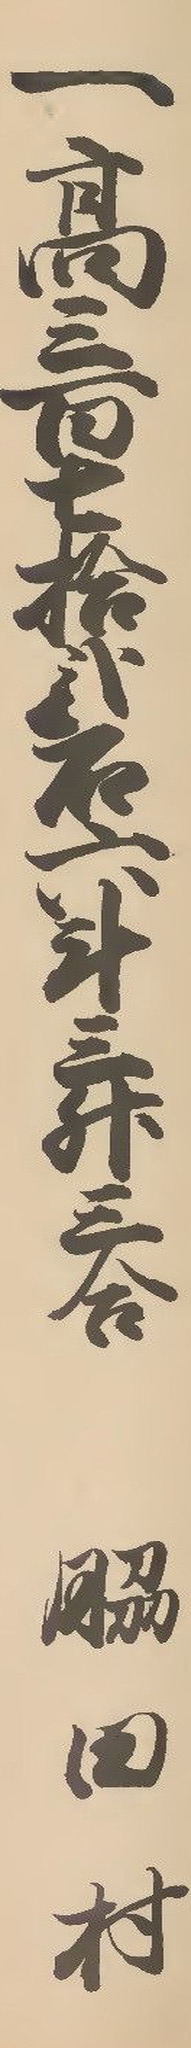一髙三百七拾弐石六斗三升三合脇田村
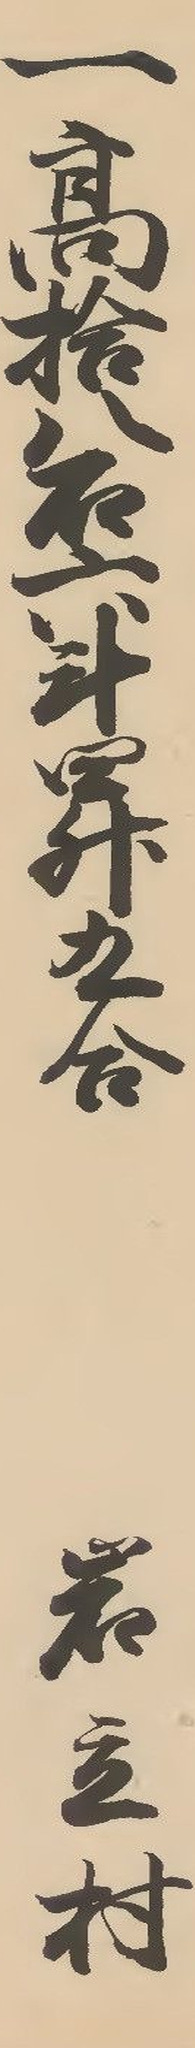一髙拾八石六斗四升九合若立村
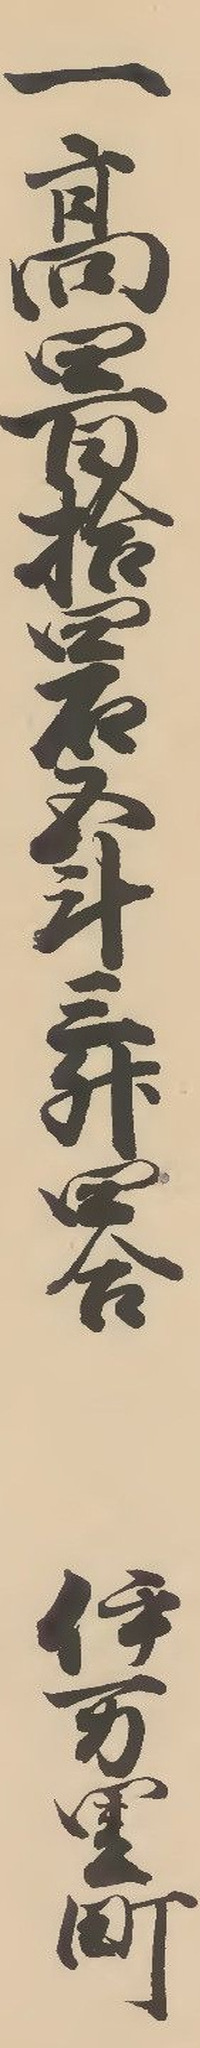一髙四百拾四石五斗三升四合伊万里町
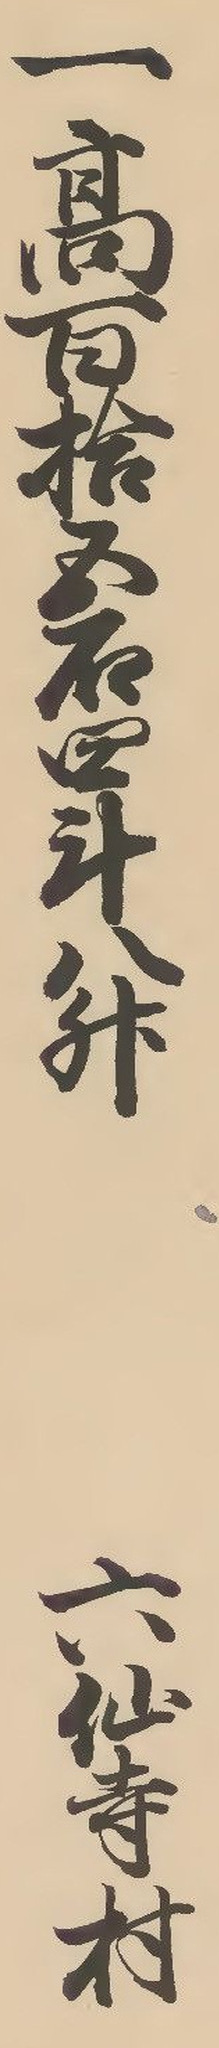一髙百拾五石四斗八升六仙寺村

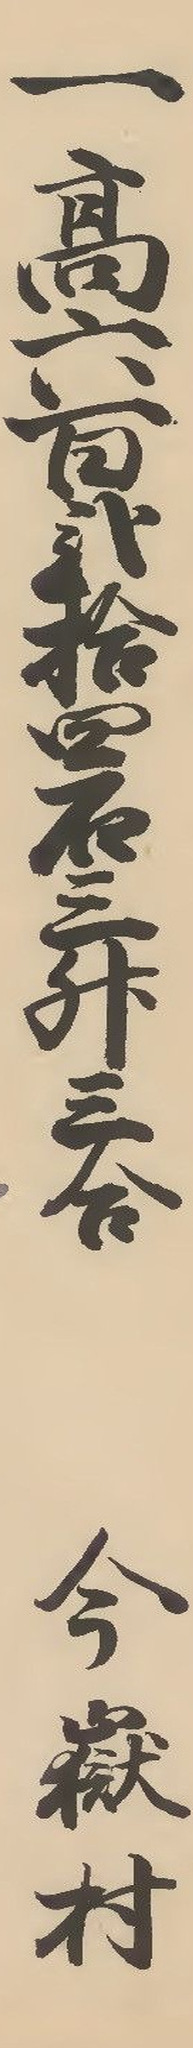一髙六百弐拾四石三升三合今嶽村
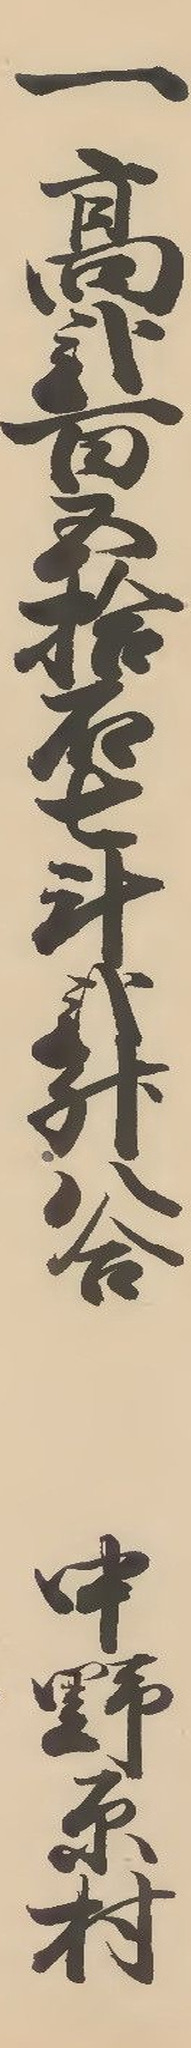一髙弐百五拾石七斗弐升八合中野原村
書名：肥前国郷帳
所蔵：国立公文書館 National Archives of Japan
